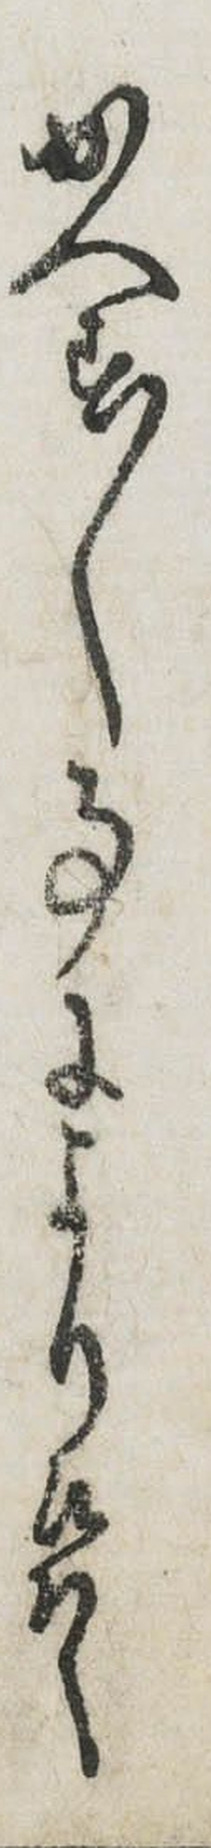かへす〳〵事により候はゝ
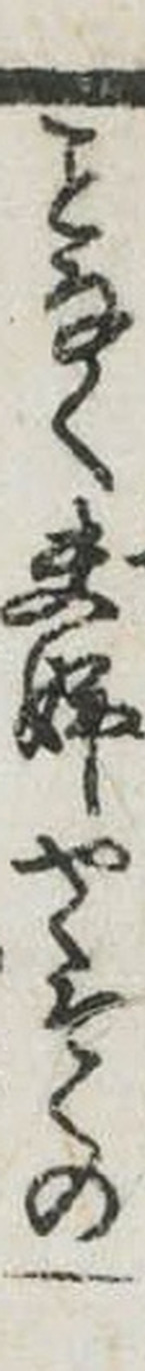ことなく夫婦やくそくの
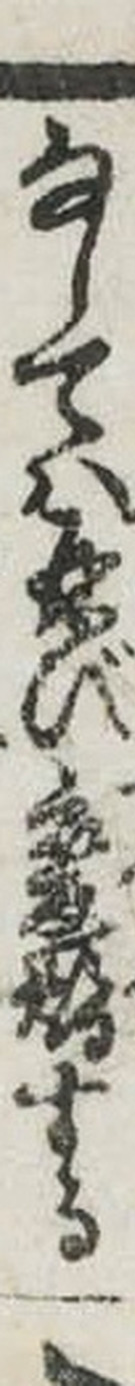なしては再び変替する
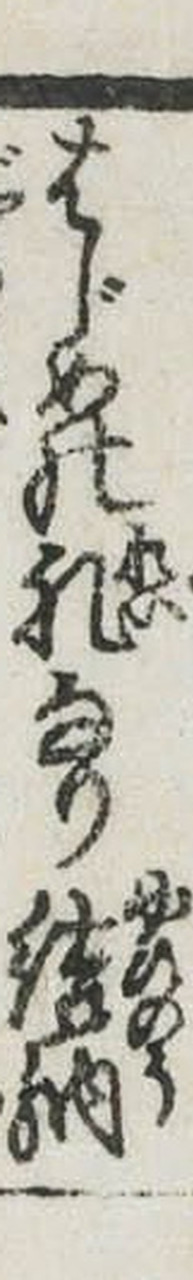はじめの礼なり結納
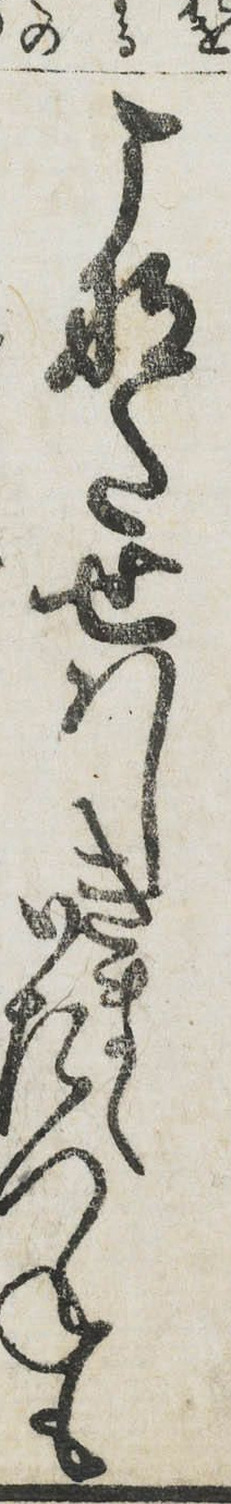こなたせはしきまゝ御たつねも
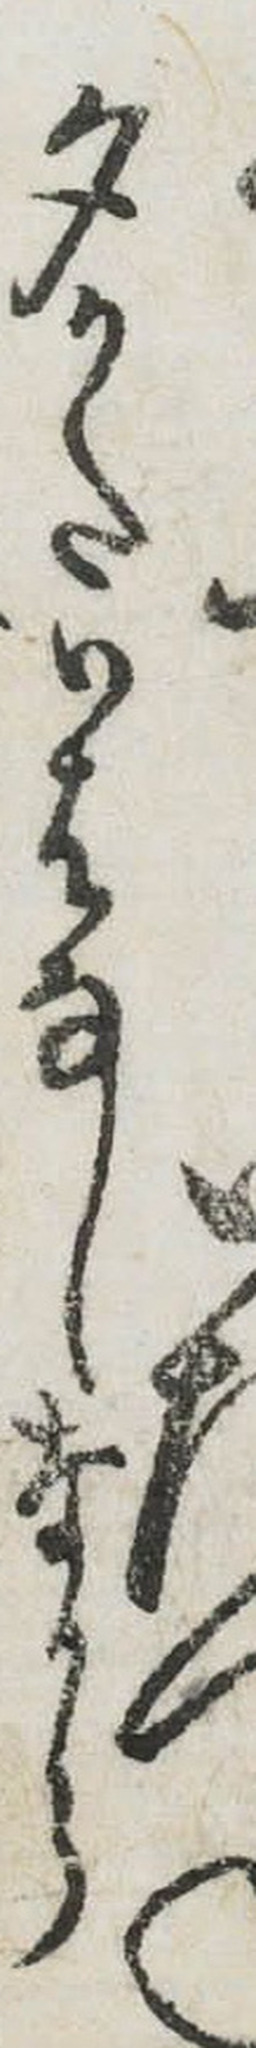夕かた御はなしなから
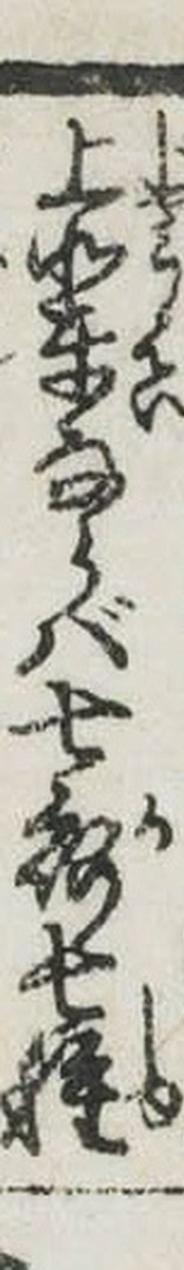上輩ならば七荷七種
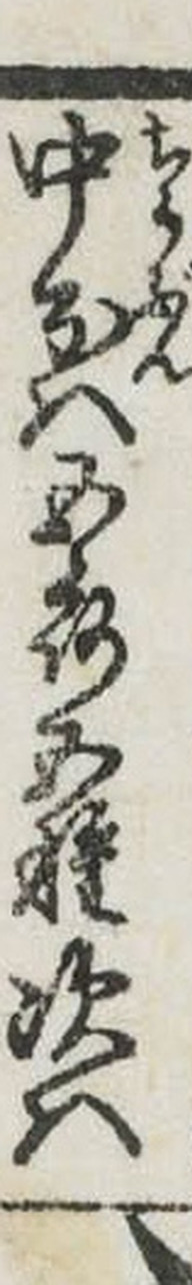中分は五荷五種次は
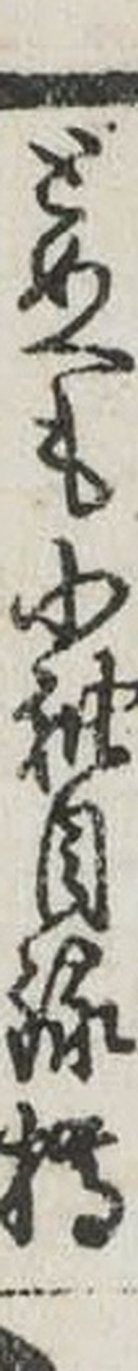とめへも小袖目録樽
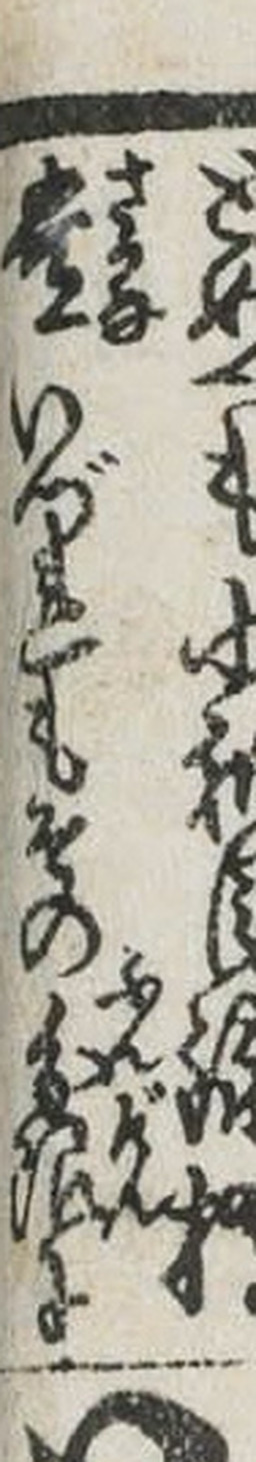肴いづれもその分限に
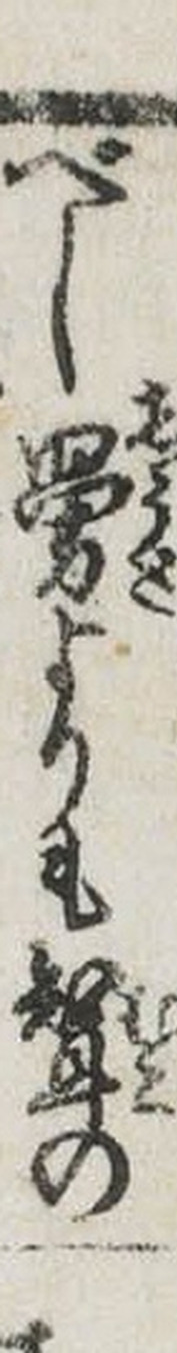べし舅よりも聟の
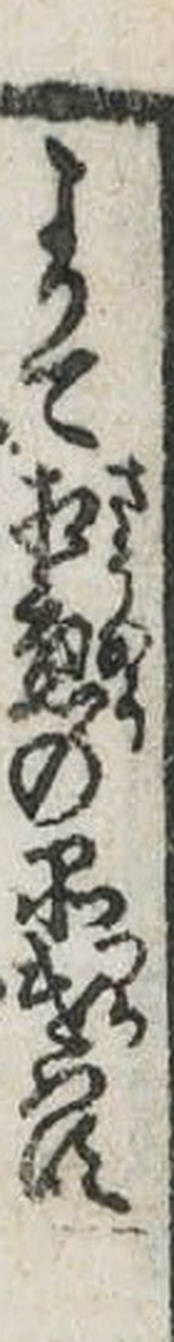よりて相応の品遣はす
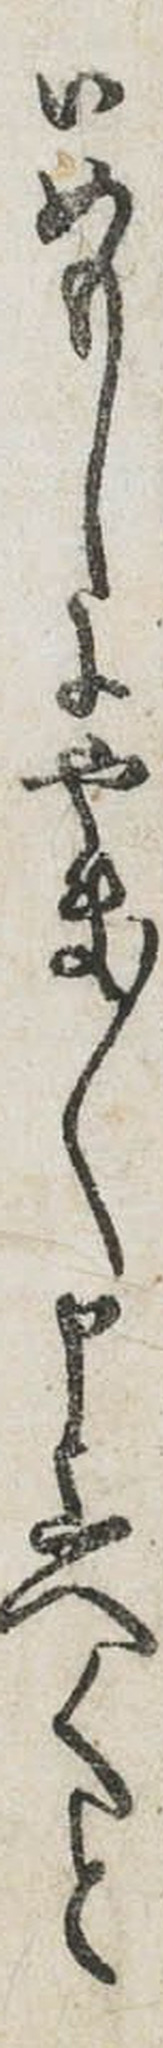御めもしにやま〳〵申上へくと
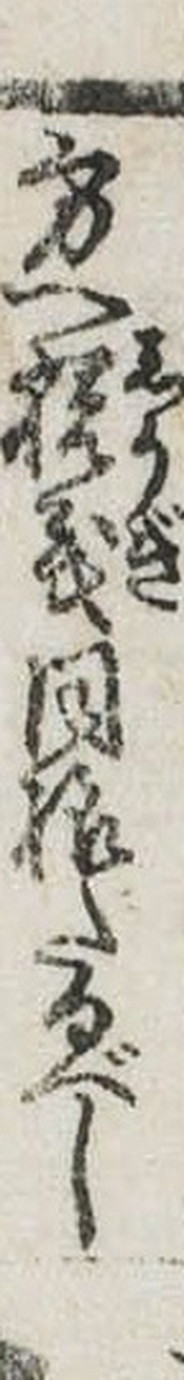方へ祝義同様たるべし
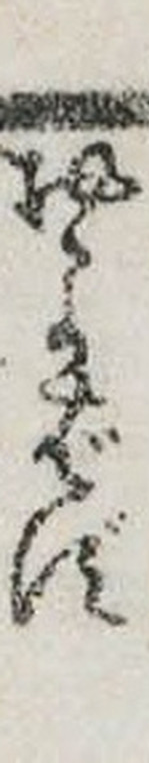およばず
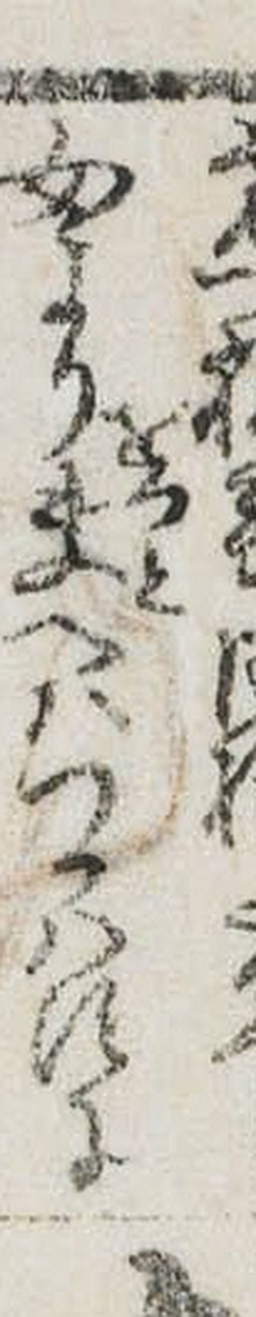女より夫へはつかはすに
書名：頭書萬用婦人手紙之文言
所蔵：東京学芸大学教育コンテンツアーカイブ
